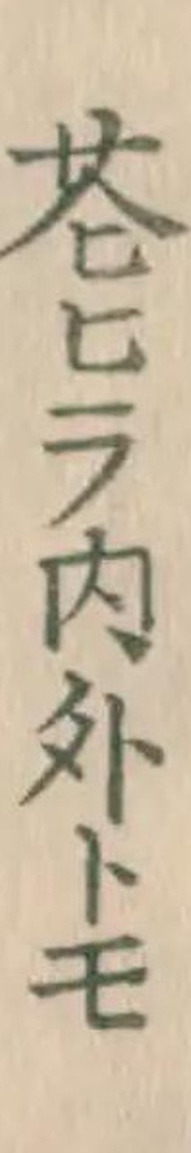花ヒラ内外トモ
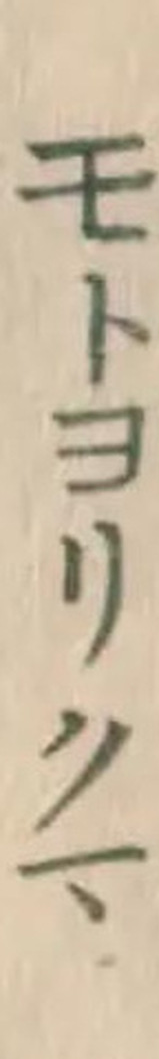モトヨリクマ
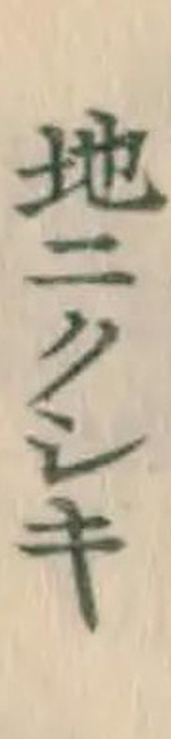地ニクシキ
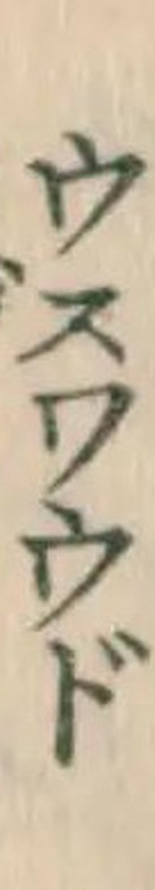ウスワウド
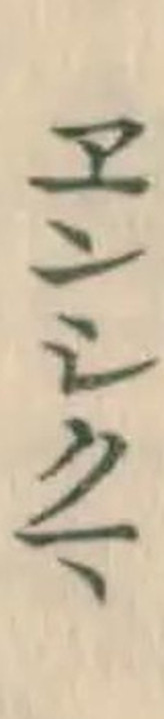ヱンシクマ
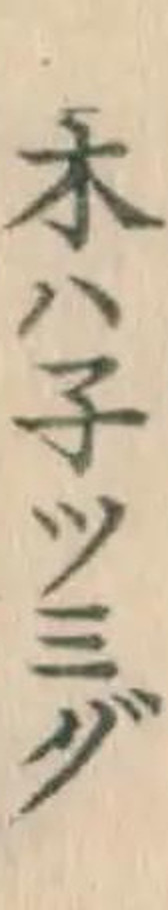木ハネツミグ
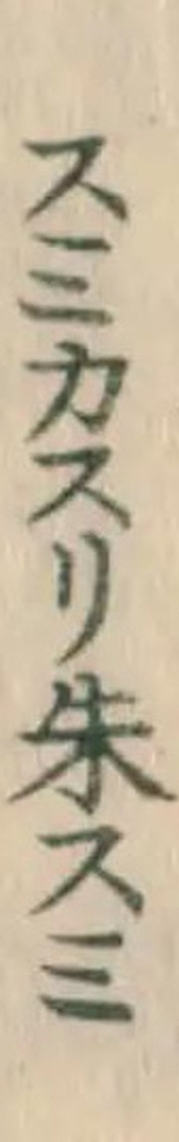スミカスリ朱スミ

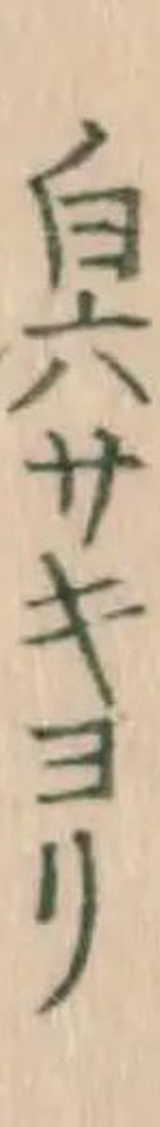白六サキヨリ
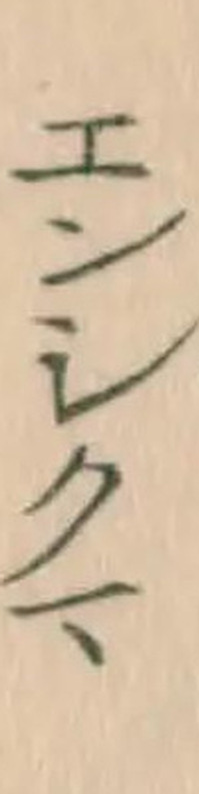エンシクマ

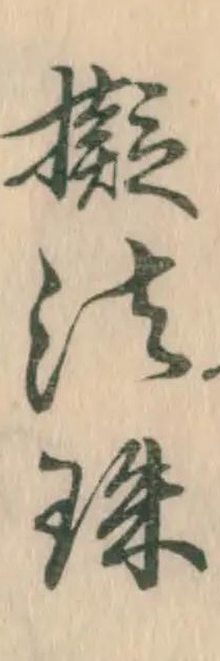擬法珠
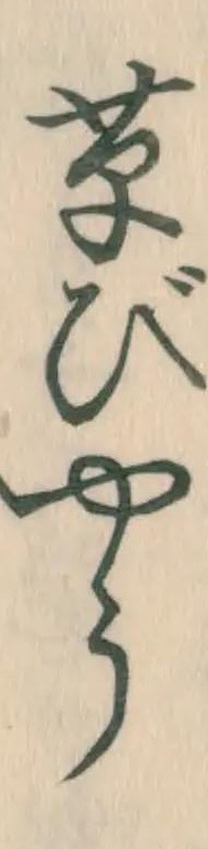草びやう
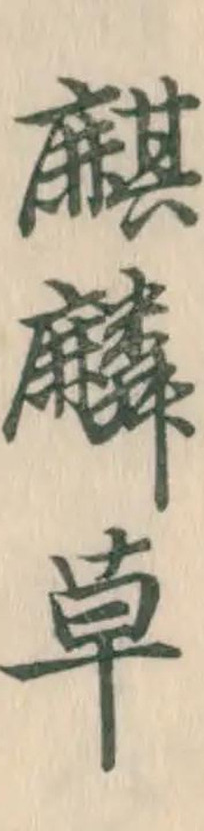麒麟草

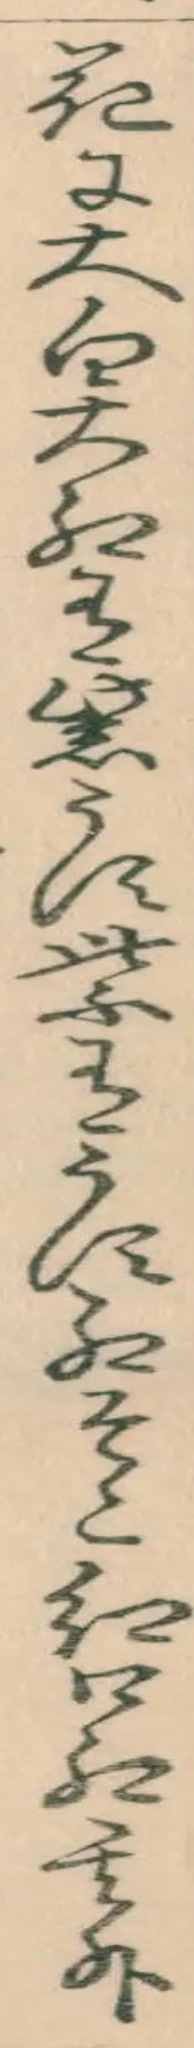花に大白大紅有紫うす紫有うす紅そこ紅口紅其外
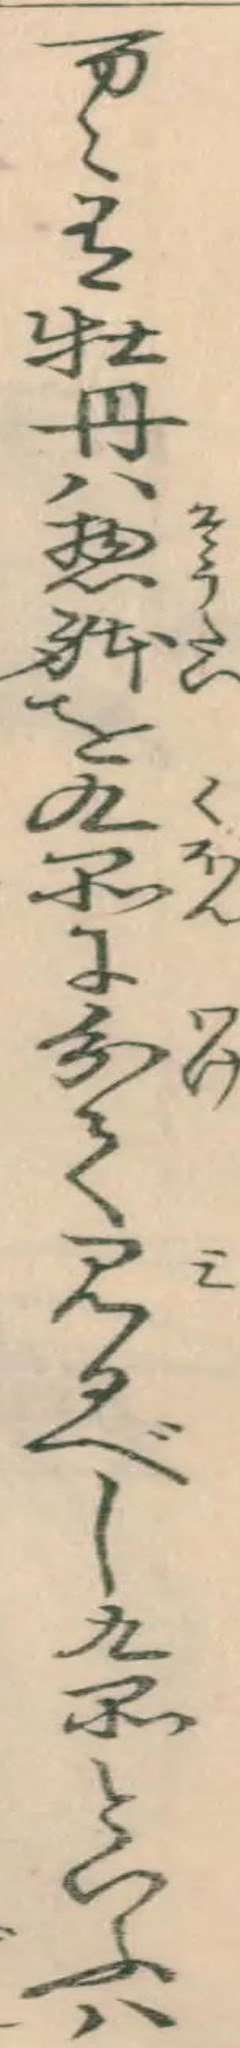万々有牡丹は総体を九品に分て見るべし九品といふは
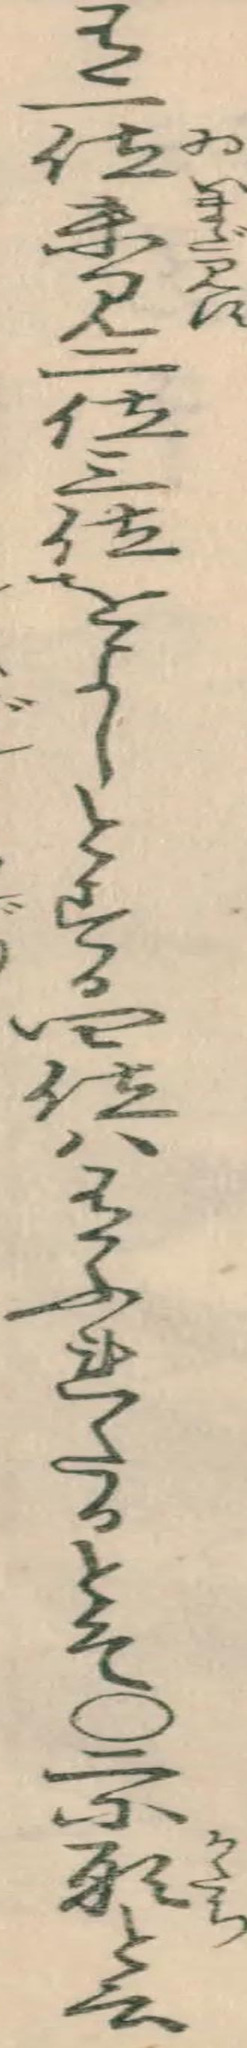有一位未見二位三位をよしとする四位は有ふれたるとそ○二に形と云
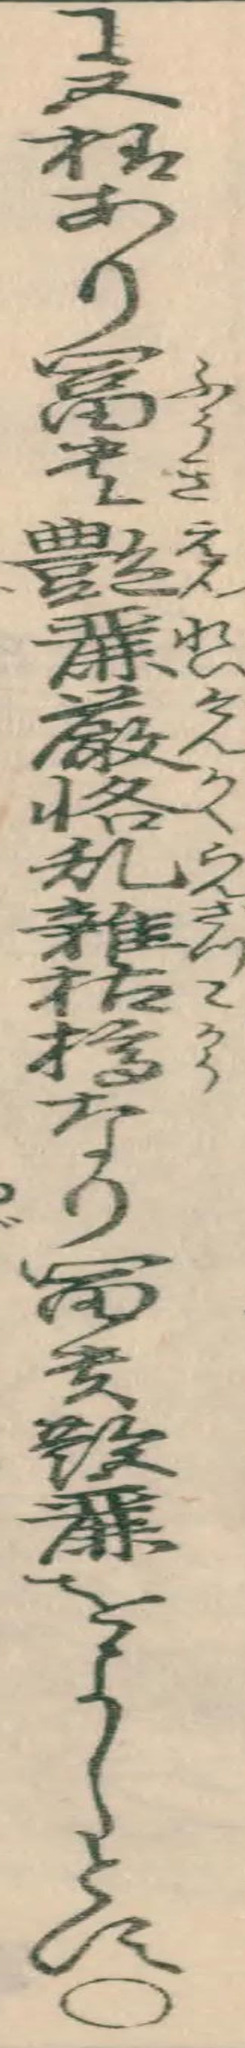に五様あり富貴艶麗厳格乱雑枯槁なり富貴艶麗をよしとす○
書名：畫本野山草. [5]
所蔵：国立国会図書館 National Diet Library, JAPAN
